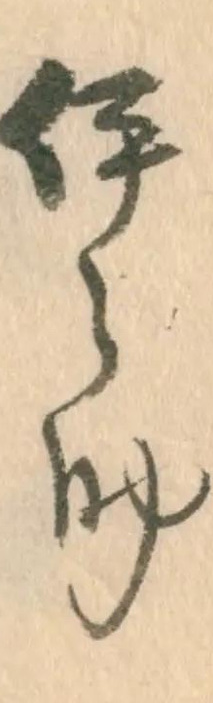伊之助
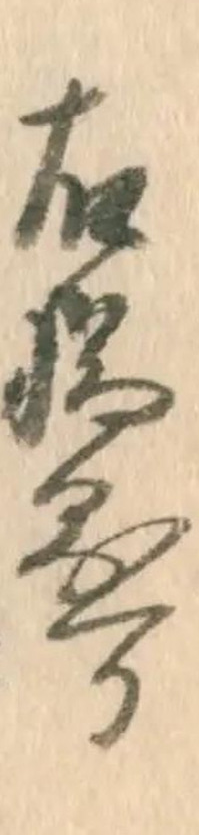右橋懸り
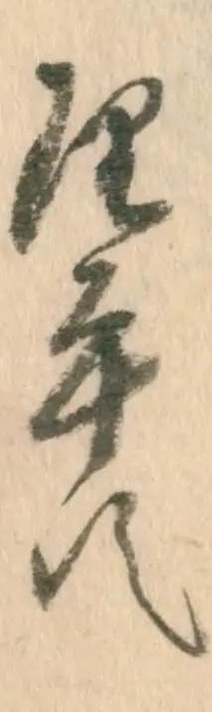理平次
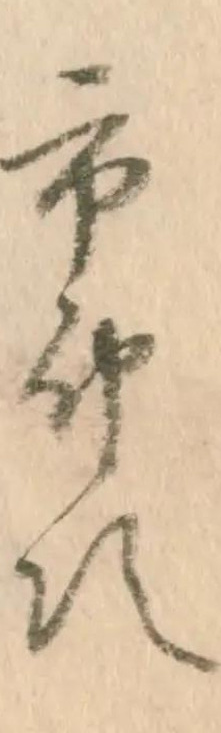市郎次
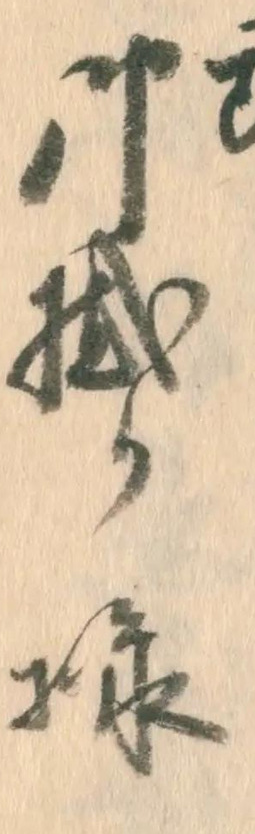御掛り様
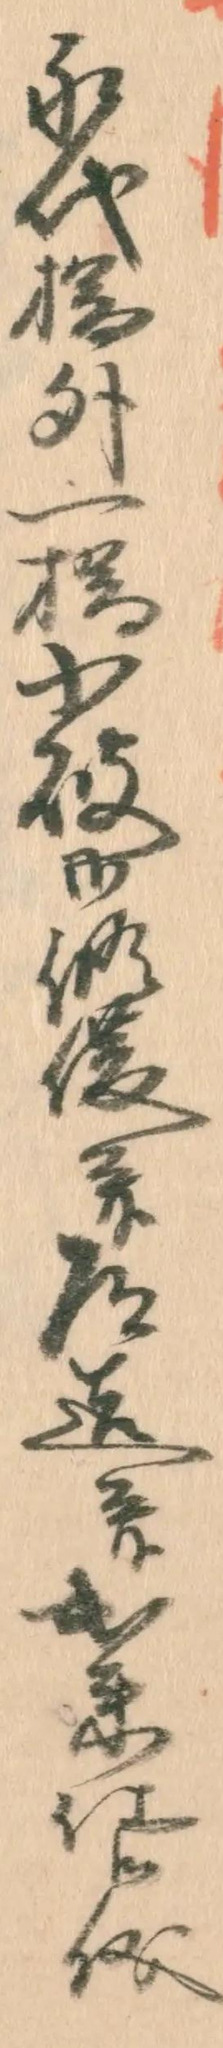永代橋外一橋小破御修復并道造出来仕候儀
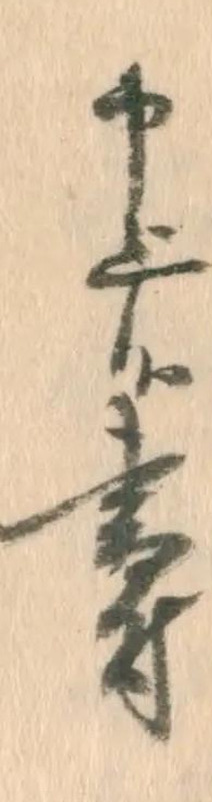申上候書付
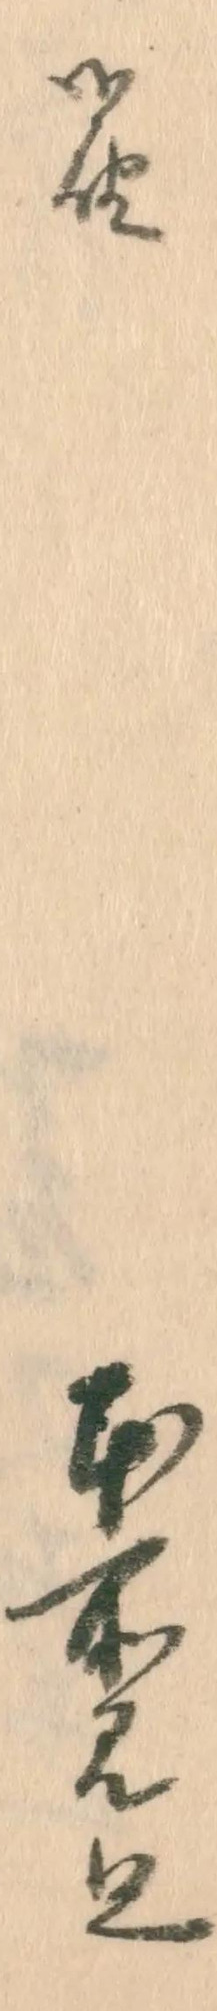御届本所見廻
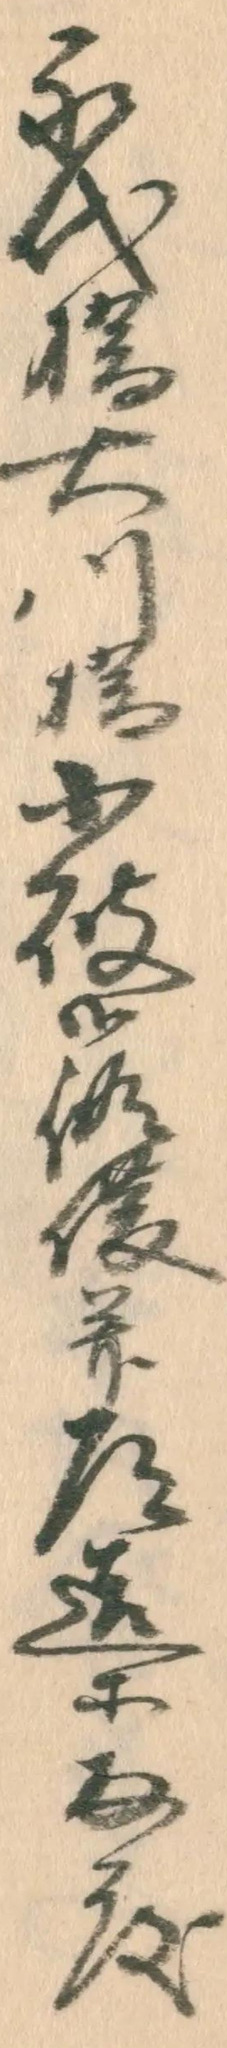永代橋大川橋小破御修復并道造等両度
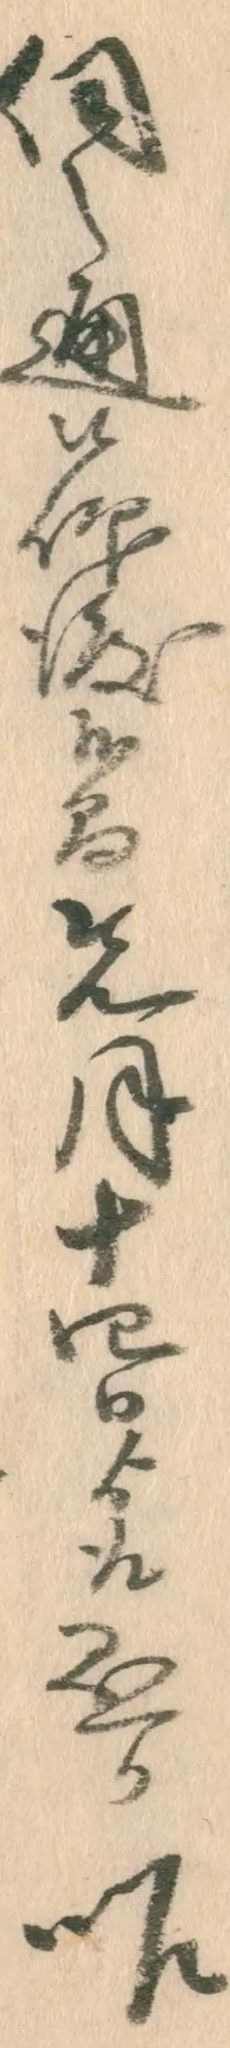伺之通被仰渡候間先月十四日ゟ取懸り昨
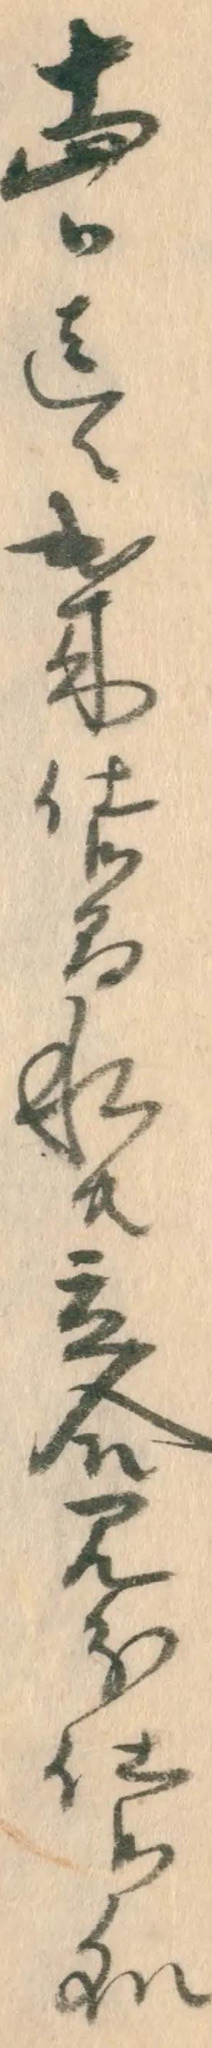十四日迄ニ出来仕候間私共立合見分仕候処

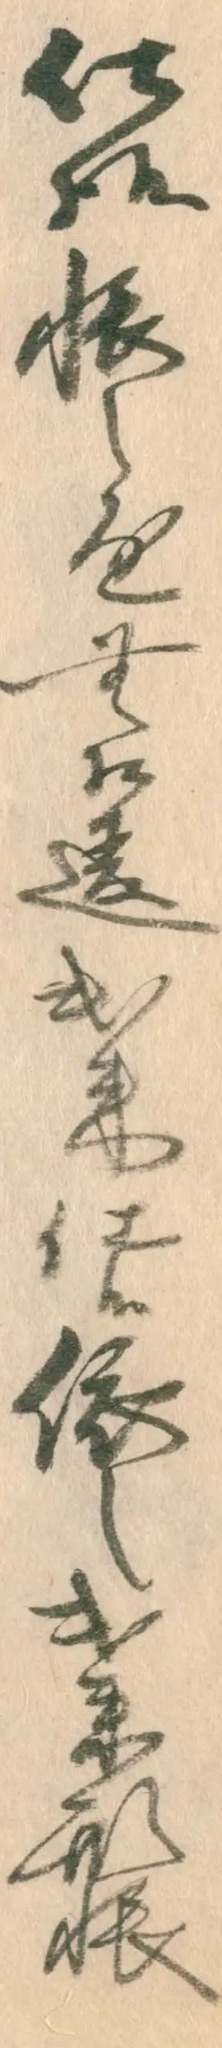仕様帳之通無相違出来仕候依之出来形帳
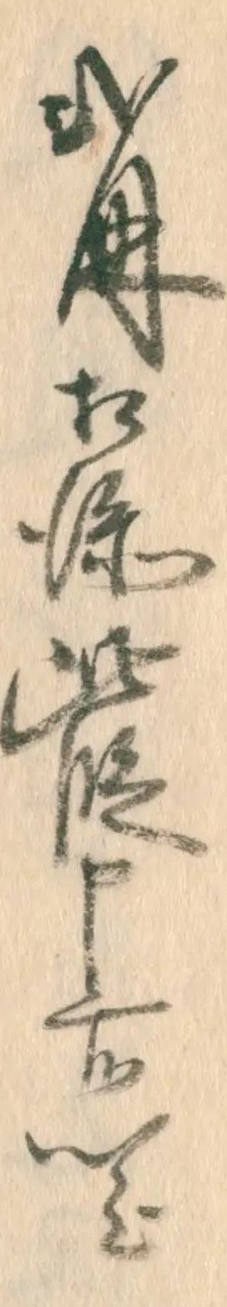弐冊相添此段申上候以上
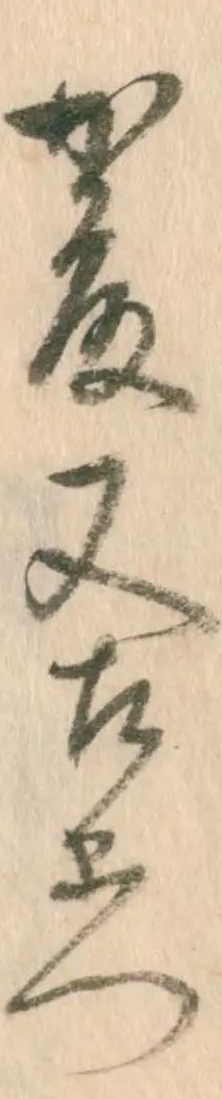加藤又左衛門
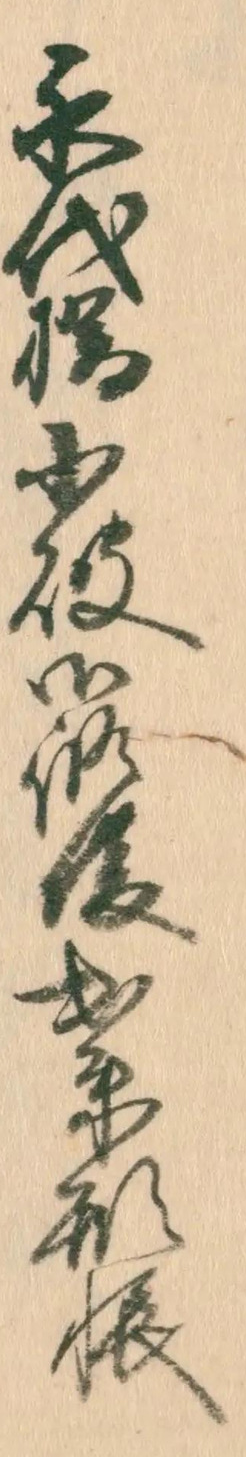永代橋小破御修復出来形帳
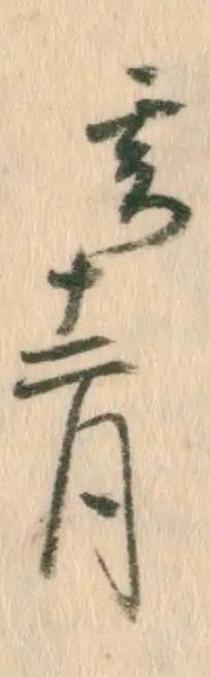亥十二月
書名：三橋 17巻. [7] 三橋小破御修復書留　但御奉行御掛リ替地震潰橋番屋　嘉永四亥年より安政二卯年迄　上
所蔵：国立国会図書館 National Diet Library, JAPAN
